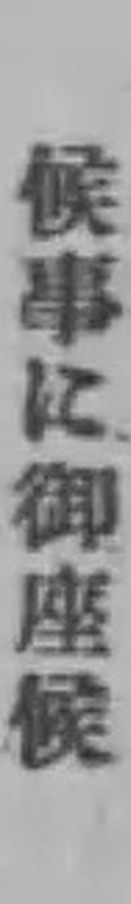候事に御座候
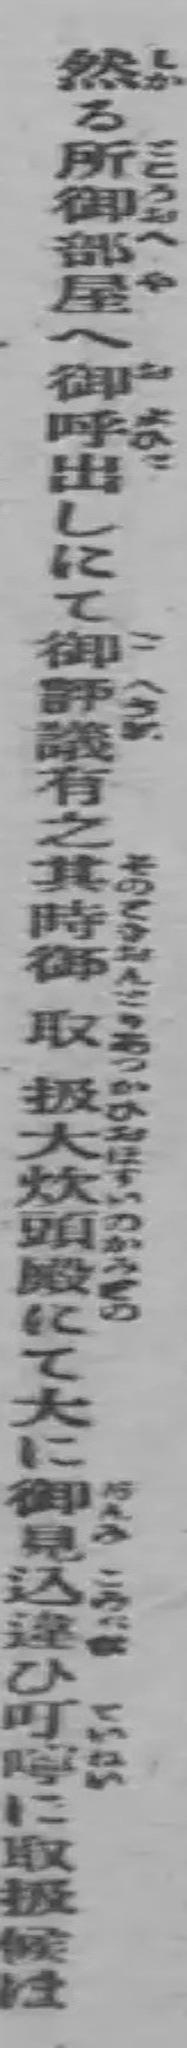然る所御部屋へ御呼出しにて御評議有之其時御取扱大炊頭殿にて大に御見込違ひ叮嚀に取扱候ほ
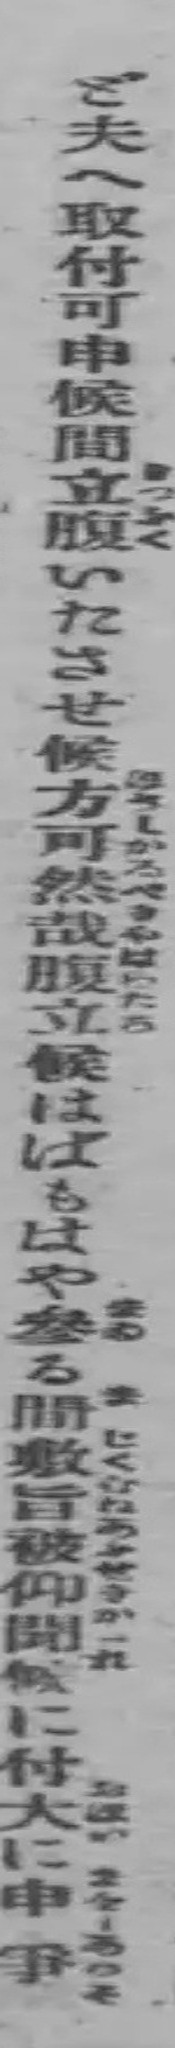ど夫へ取付可申候間立腹いたさせ候方可然哉腹立候はばもはや参る間敷旨被仰聞候に付大に申争
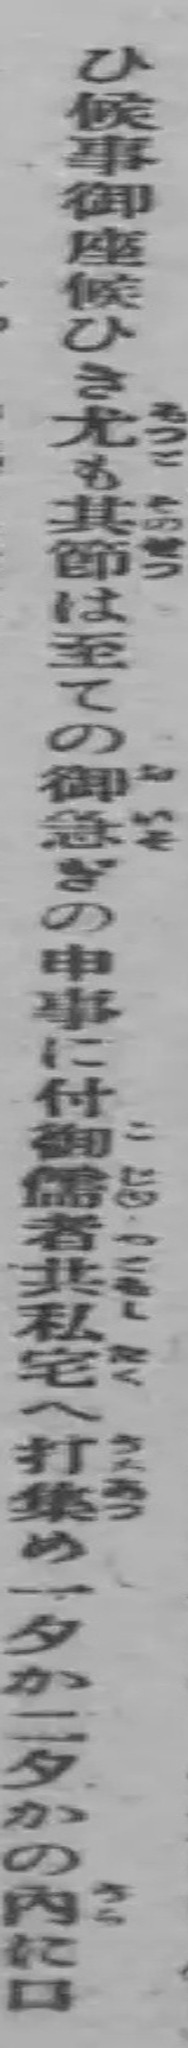ひ候事御座候ひき尤も其節は至ての御急ぎの申事に付御儒者共私宅へ打集め一夕か二夕の内に口
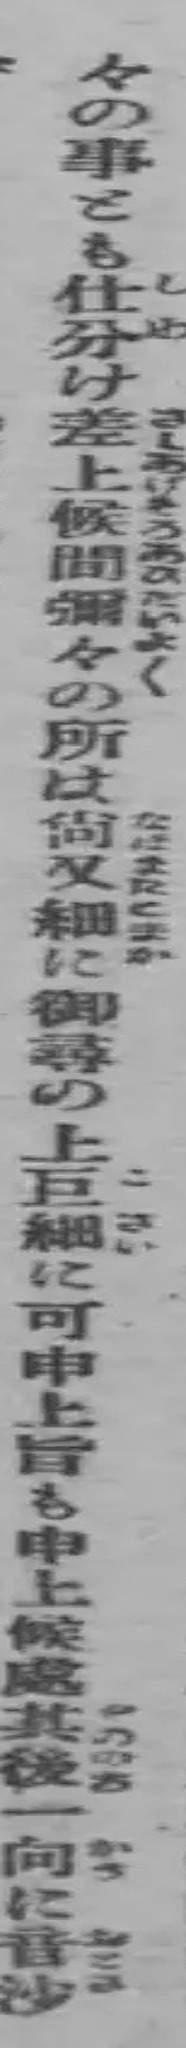々の事とも仕分け差上候間弥々の所は尚又細に御尋の上巨細に可申上旨も申上候処其後一向に音沙
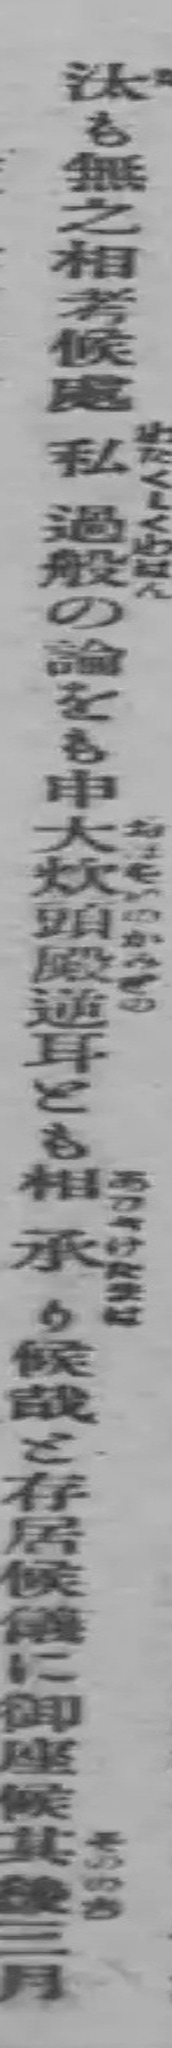汰も無之相考候処私過般の論をも申大炊頭殿逆耳とも相承り候哉と存居候儀に御座候其後三月
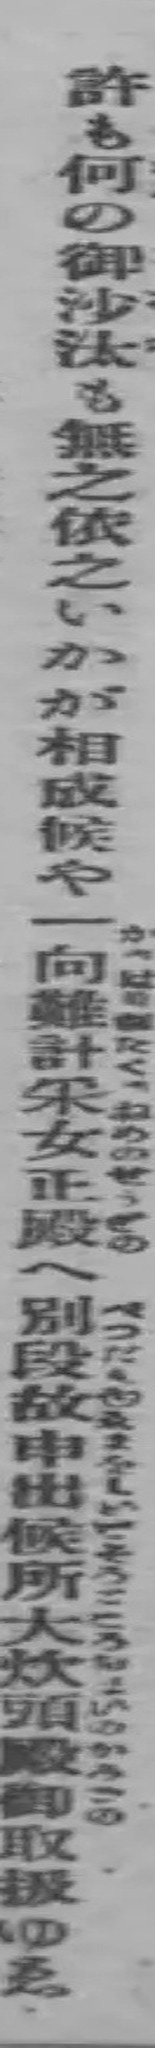許も何の御沙汰も無之依之いかが相成候や一向難計采女正殿へ別段故申出候所大炊頭殿御取扱ゆゑ
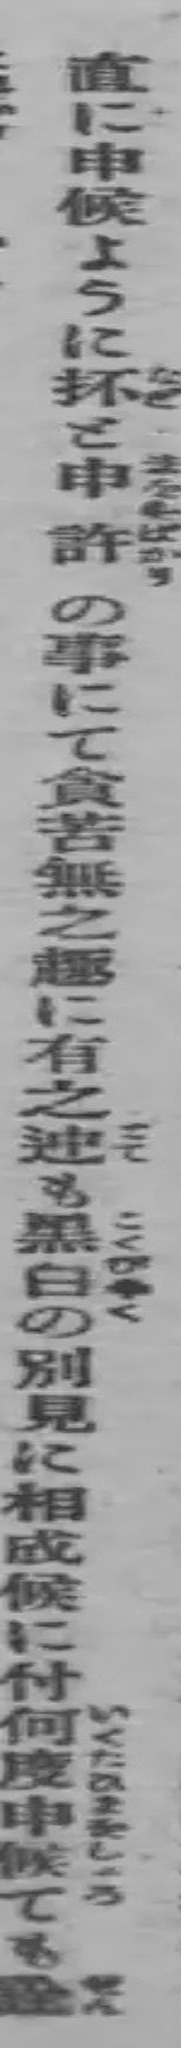直に申候ように抔と申許の事にて貧苦無之趣に有之迚も黒白の別見に相成候に付何度申候ても詮
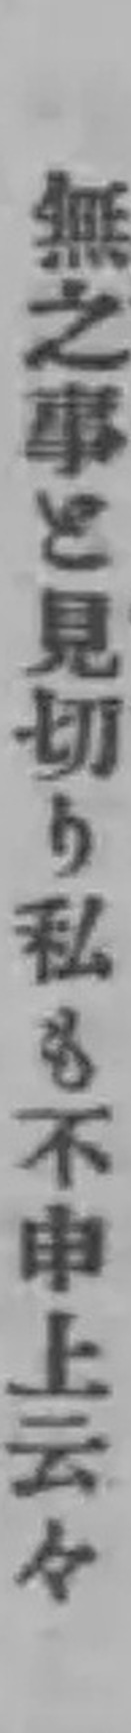無之事と見切り私も不申上云々
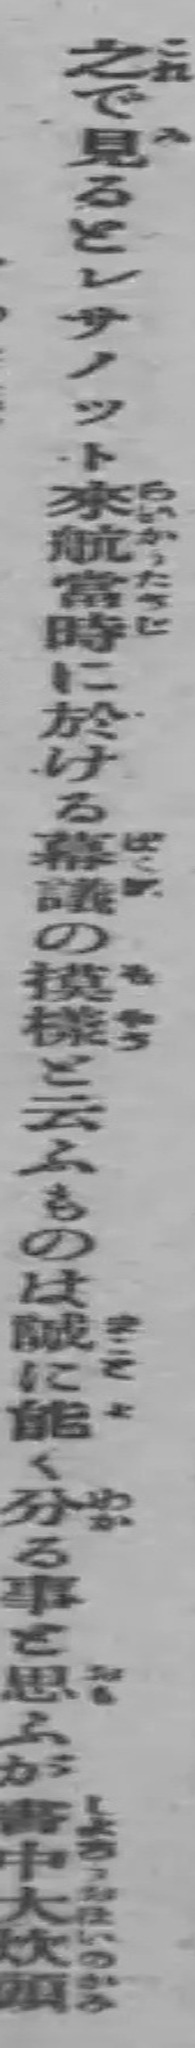之で見るとレサノツト来航当時に於ける幕議の模様と云ふものは誠に能く分る事と思ふが書中大炊頭
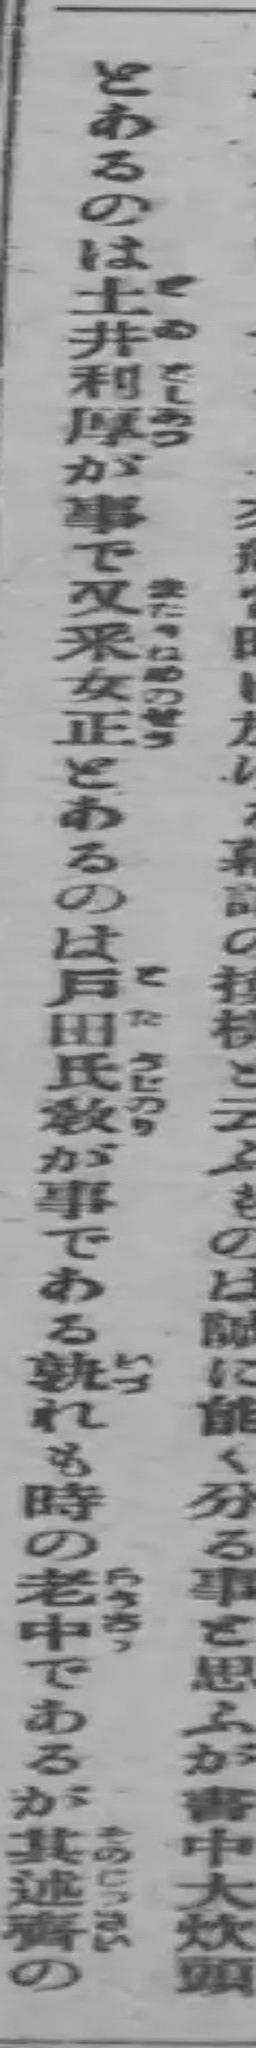とあるのは土井利厚が事で又采女正とあるのは戸田氏教が事である孰れも時の老中である其述斉の
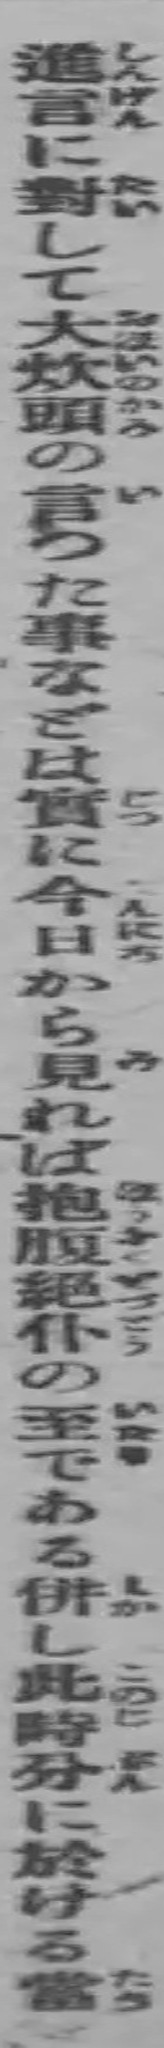進言に対して大炊頭の言つた事などは実に今日から見れば抱腹絶仆の至である併し此時分に於ける当
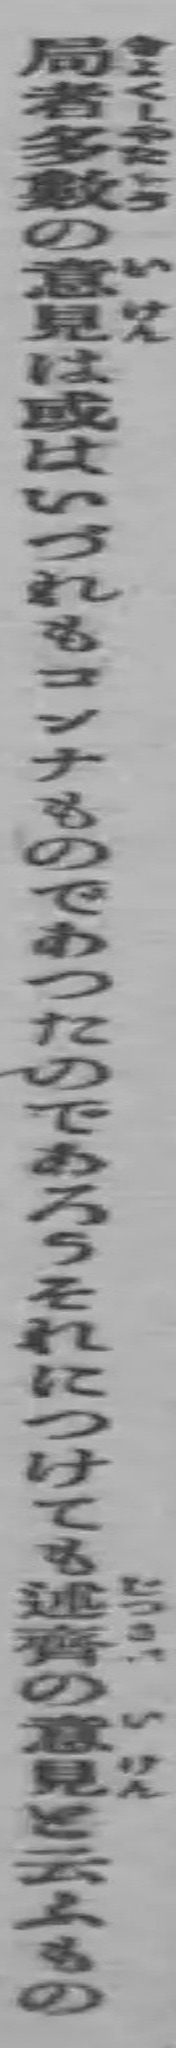局者多数の意見は或はいづれもコンナものであつたのであろうそれにつけても述斉の意見と云ふもの
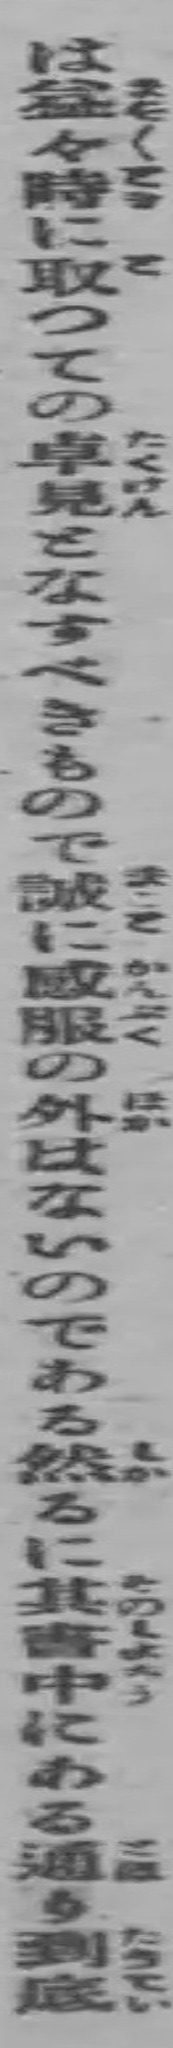は益々時に取つての卓見となすべきもので誠に感服の外はないのである然るに其書中にある通り到底
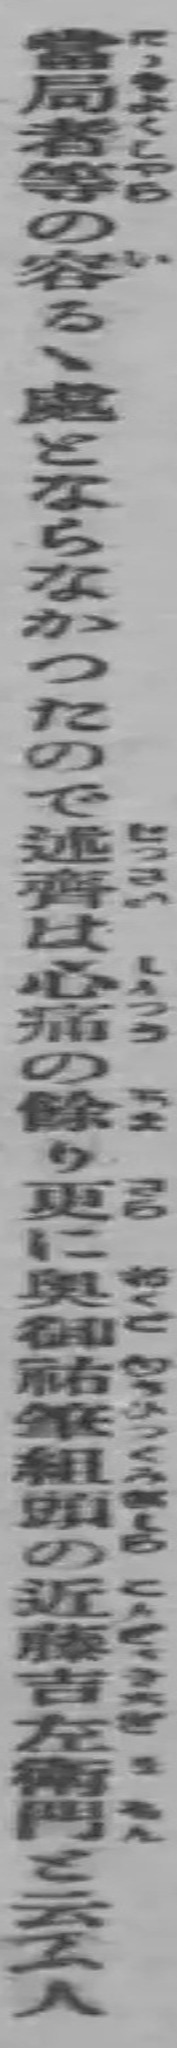当局者等の容るゝ処とならなかつたので述斉は心痛の余り更に奥御祐筆組頭の近藤吉左衛門と云ふ人
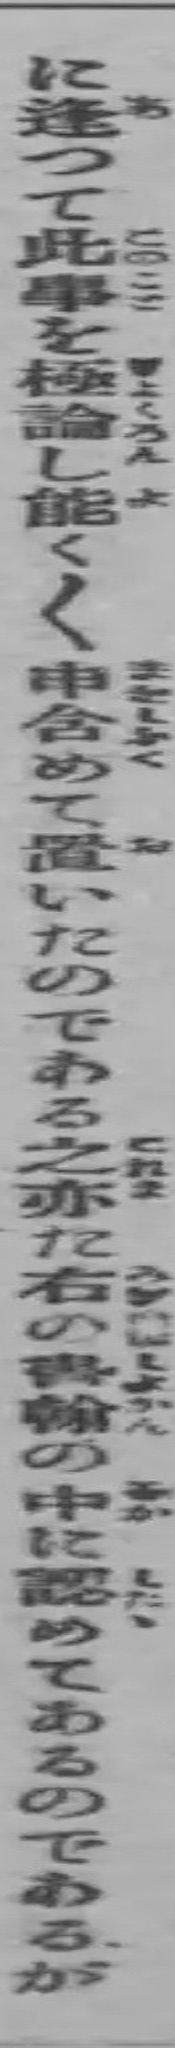に逢つて此事を極論し能く〳〵申含めて置いたのである之亦た右の書翰の中に認めてあるのであるが
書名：豊橋市史談
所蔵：国立国会図書館 National Diet Library, JAPAN
